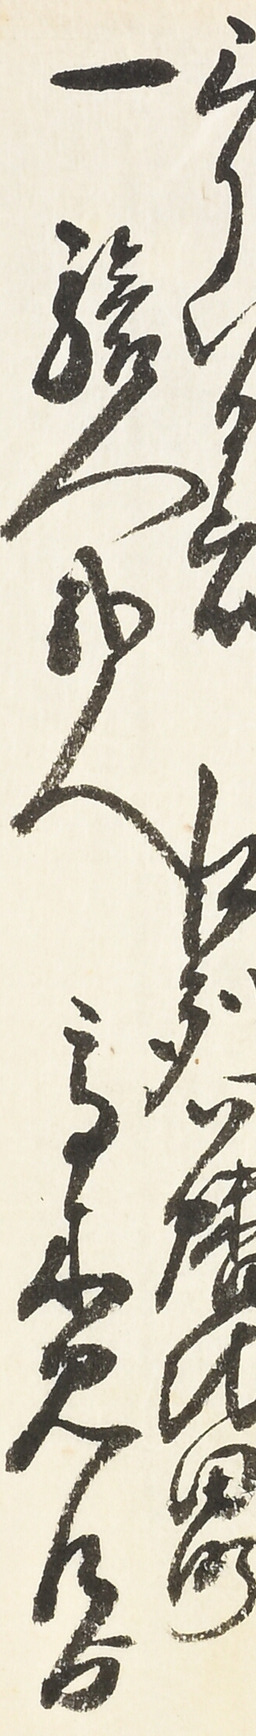一旅人弐人高木忠左衛門
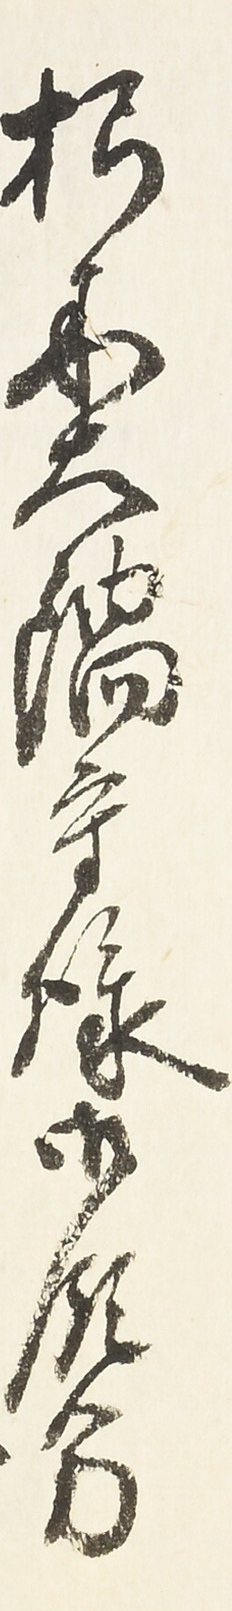朽木大隅守様御領分
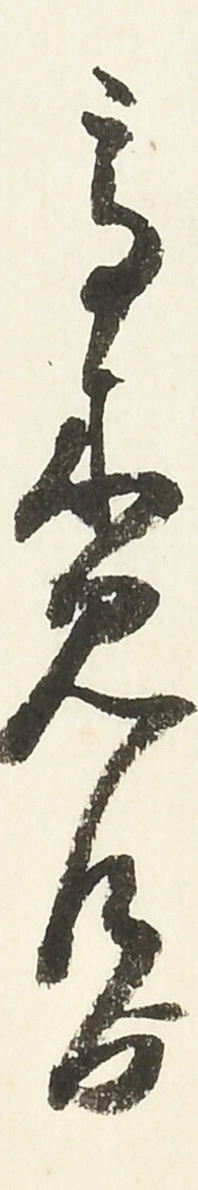宿忠左衛門
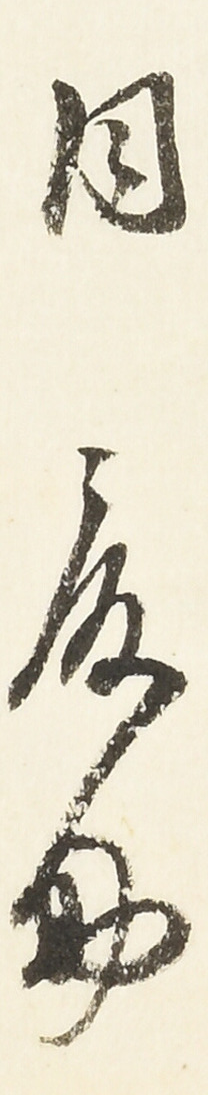同藤助
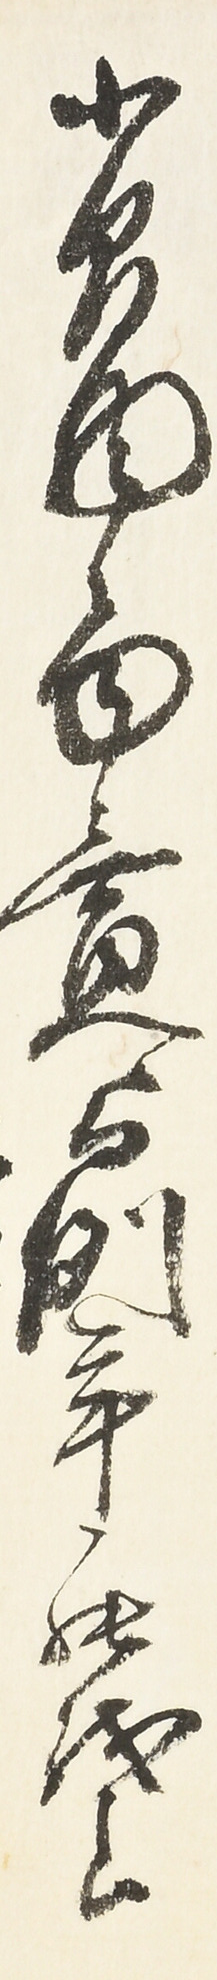小間物商売ニ而例年罷越申候
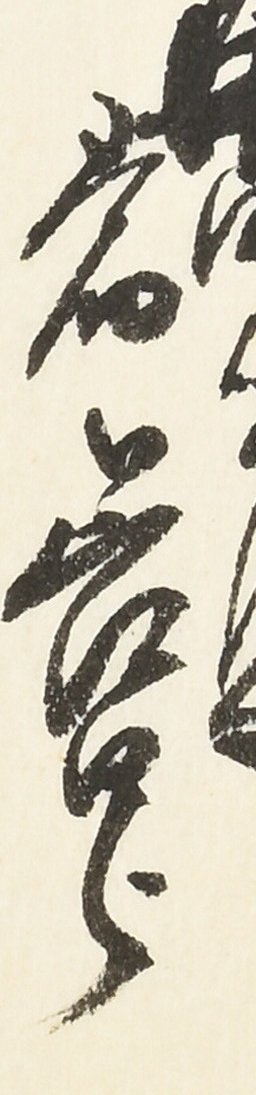宿善四郎
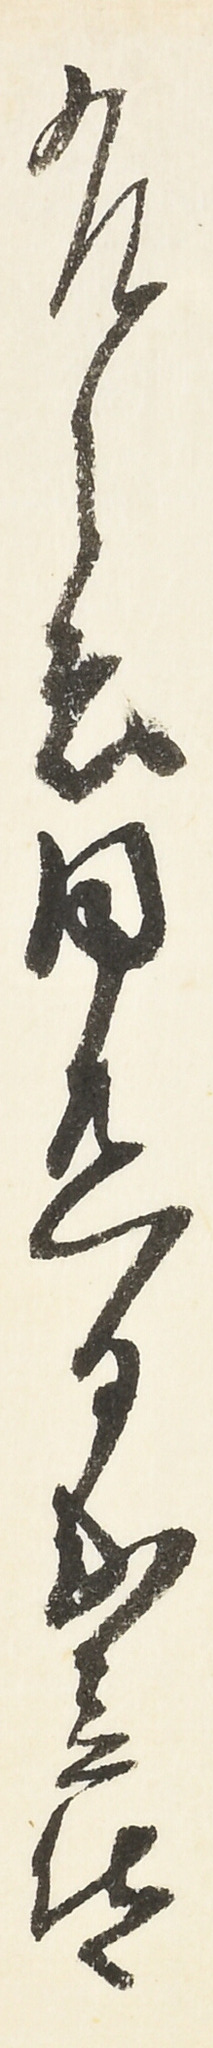右之者同廿一日出立仕候
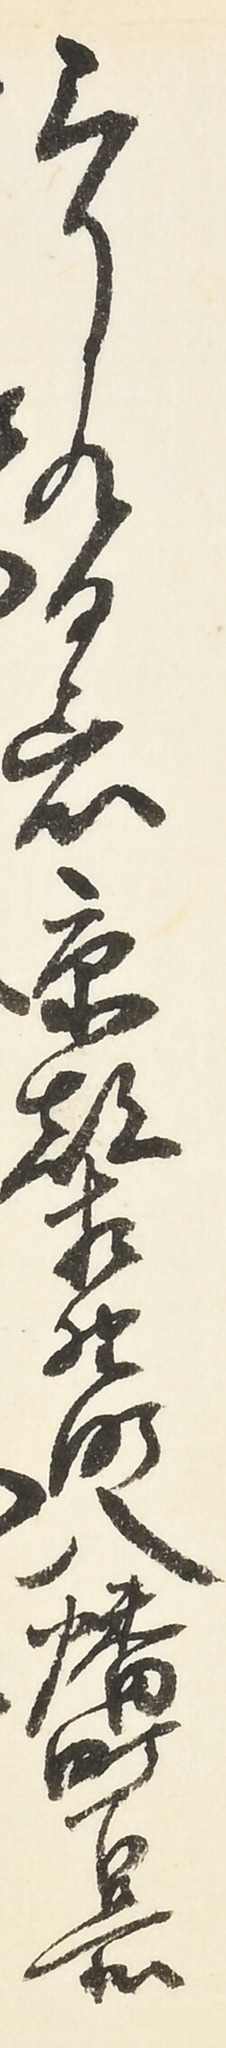三月九日着京都相野町八幡町下ル所
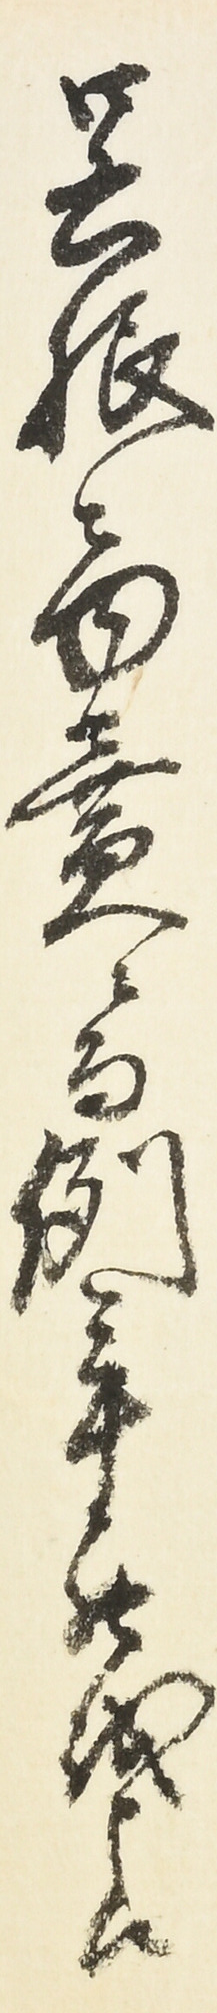呉服商売ニ而例年罷越申候
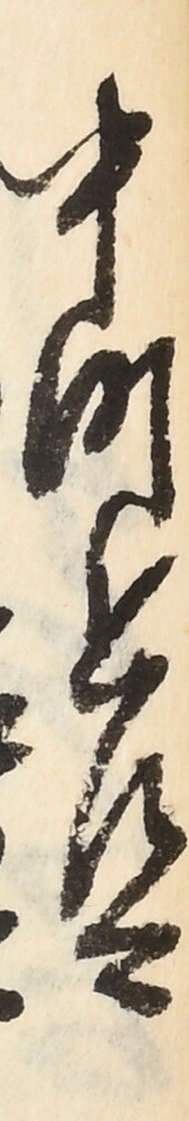中町近江屋
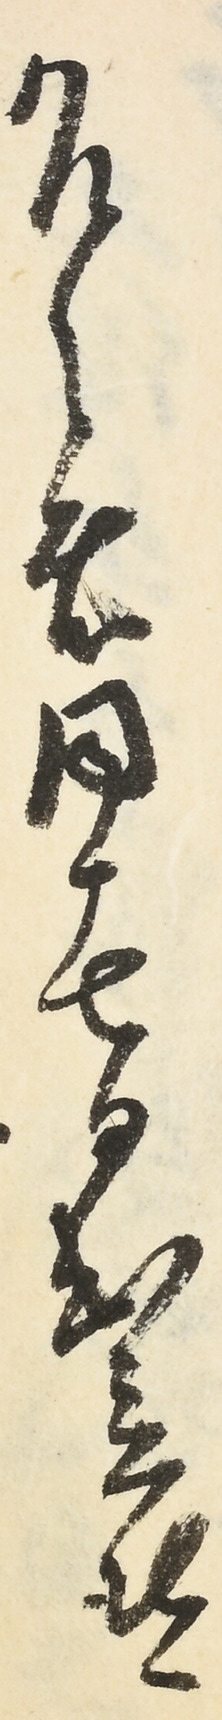右之者同六日出立仕候
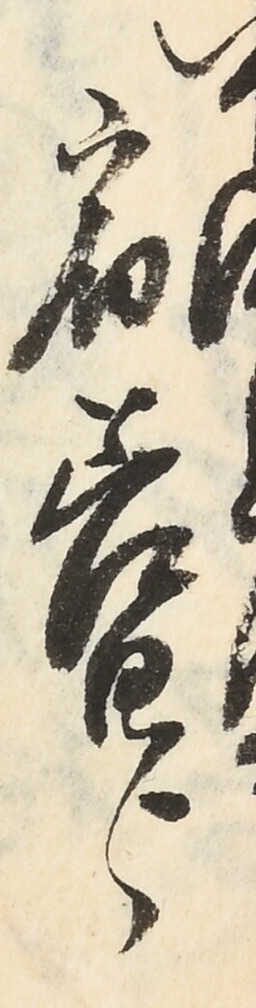宿善四郎
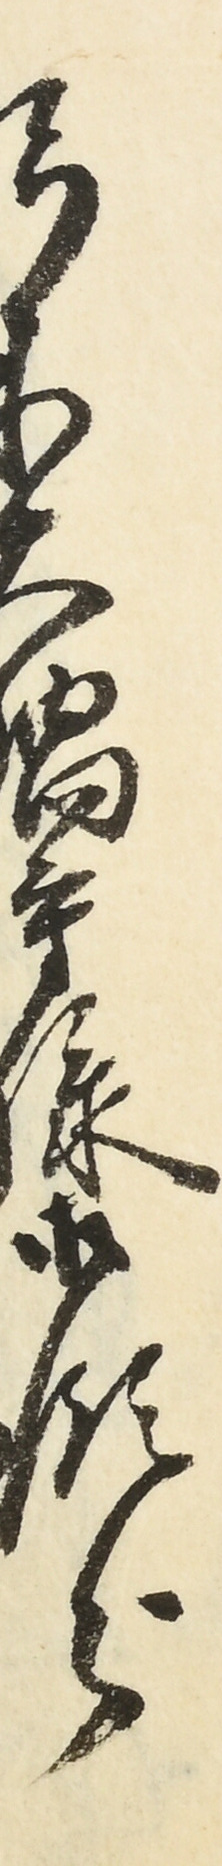朽木大隅守様御領分

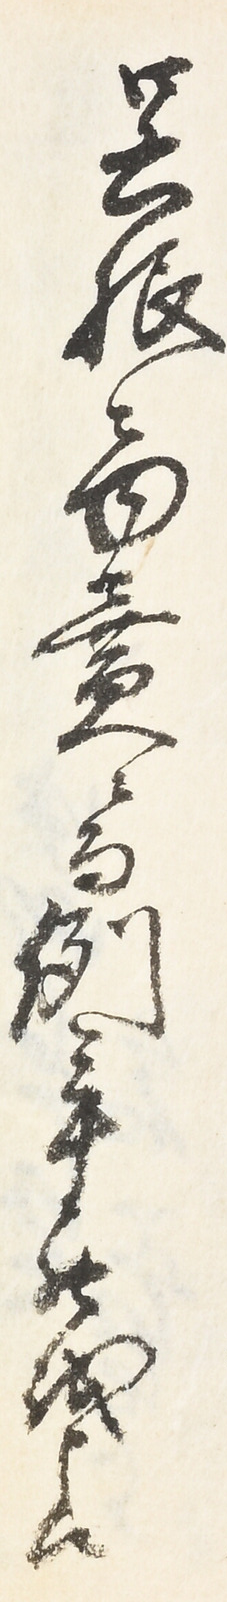小間物商売ニ而例年罷越申候
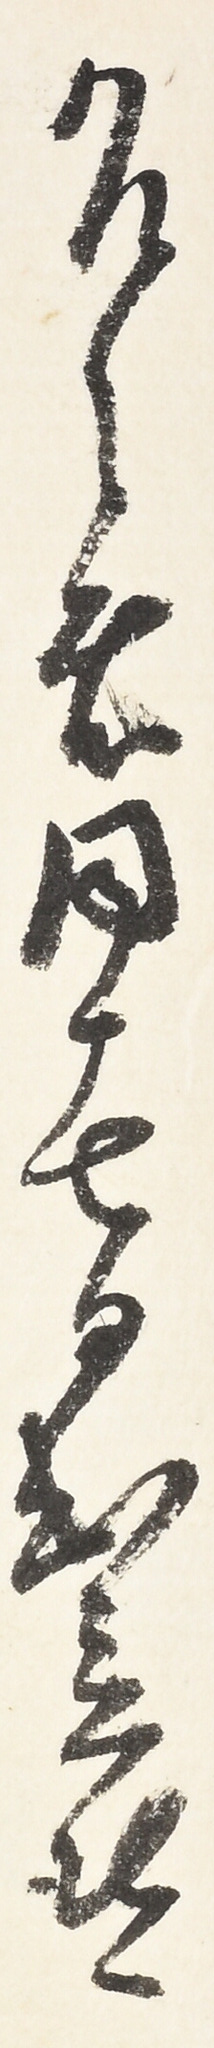右之者同十七日出立仕候
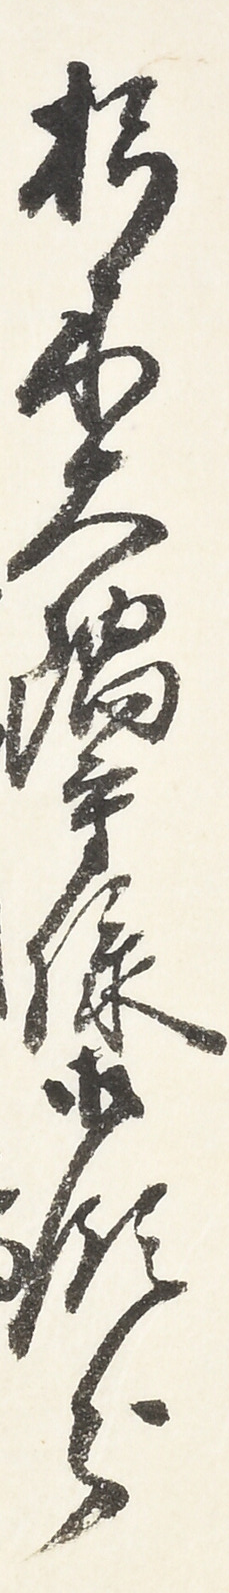朽木大隅守様御領分
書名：町中旅人泊控帳
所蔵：伊那市立高遠町図書館・合同会社AMANE
